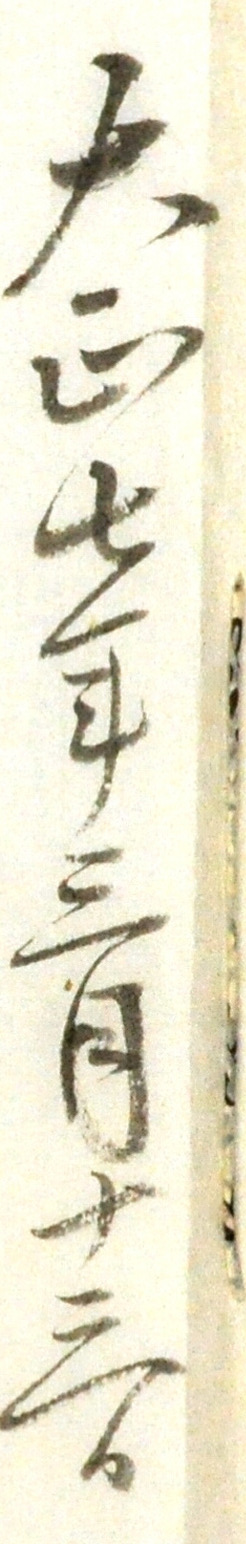大正七年三月十三日
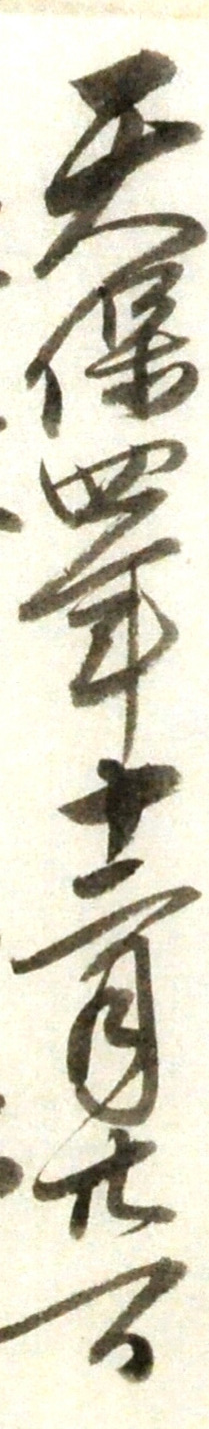天保四年十二月廿一日
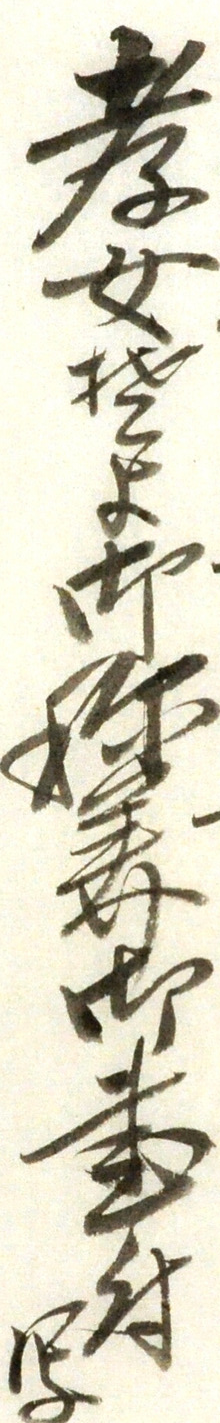孝女そよ御称美御書付
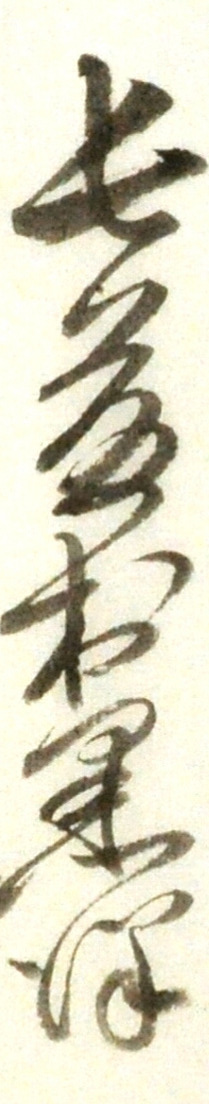長藤村黒澤
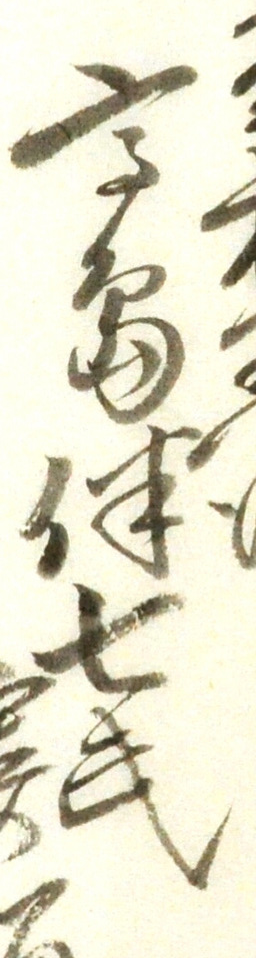高島伴七氏

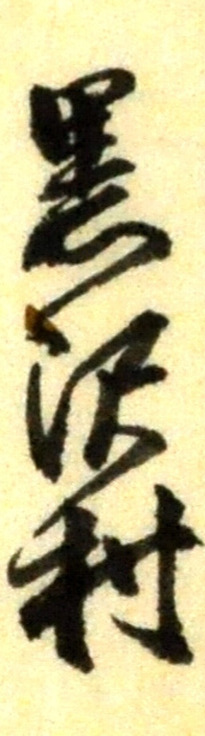黒沢村
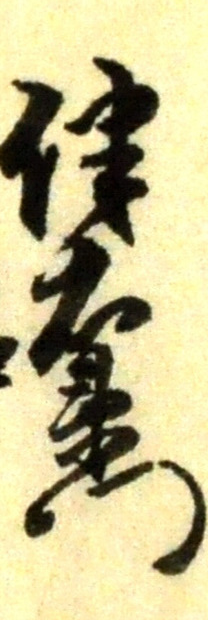伴右衛門
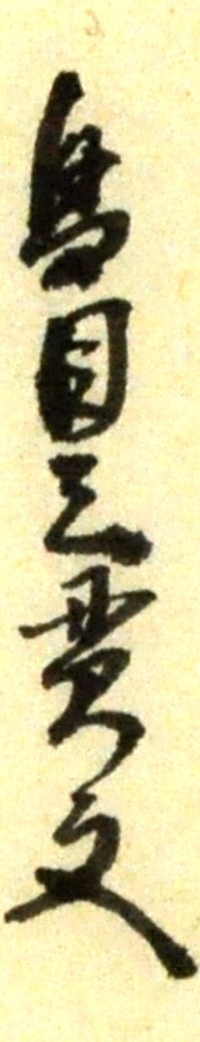鳥目三貫文
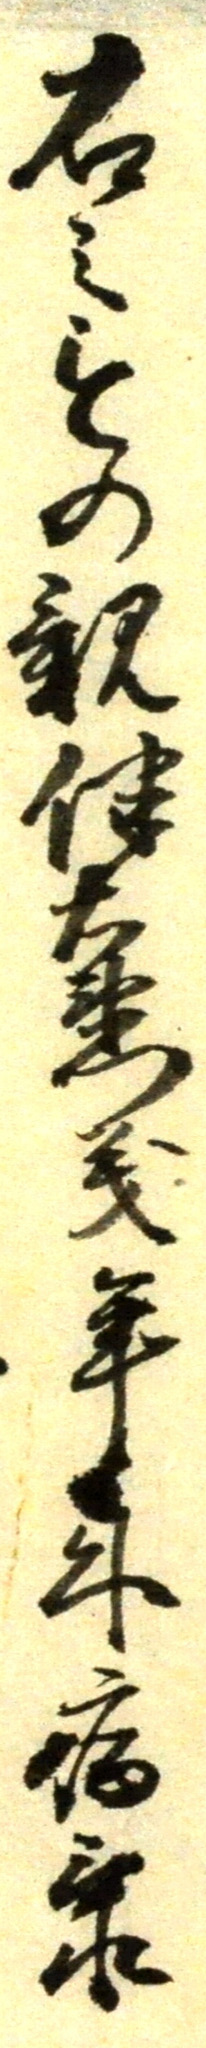右之もの親伴右衛門義年来病気
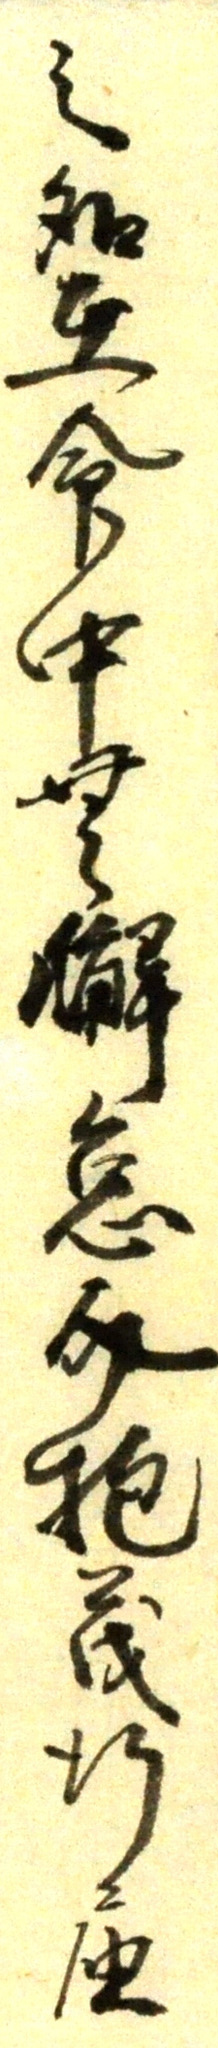之処在命中無懈怠介抱も行届
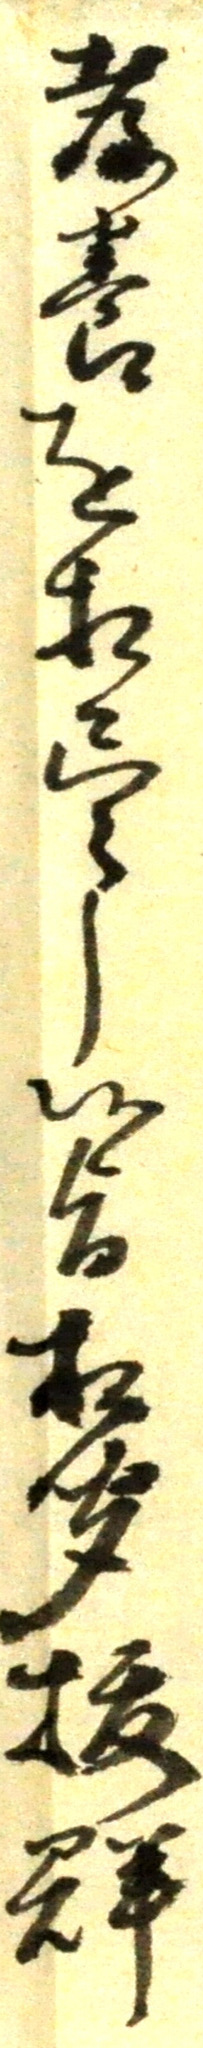孝養を相尽し候旨相聞抜群
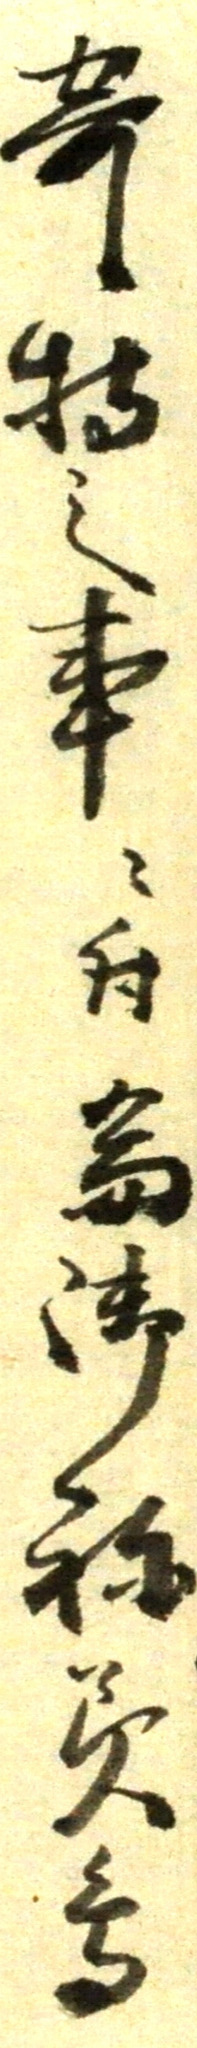奇特之事ニ付為御称美鳥
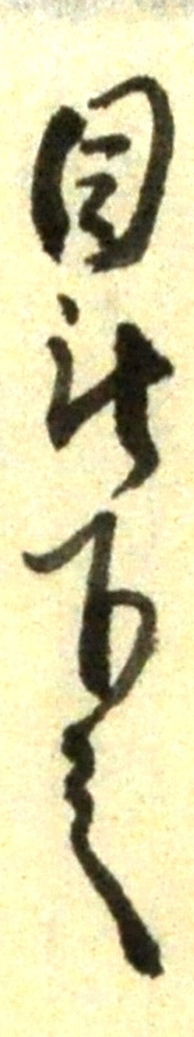目被下之
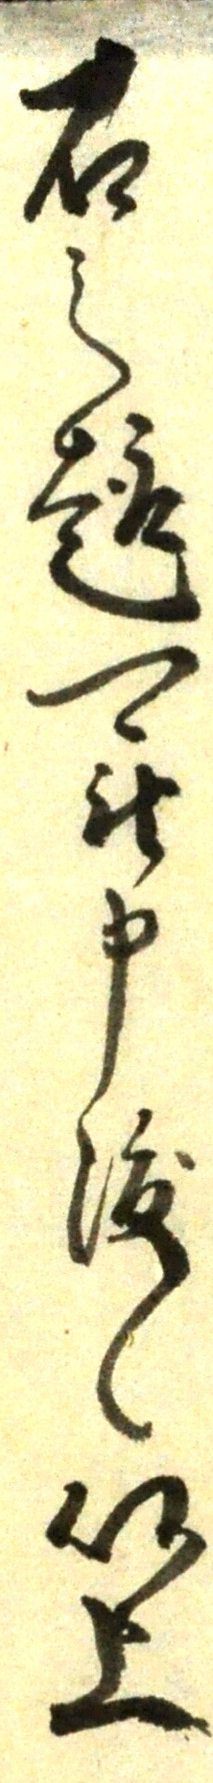右之趣可被申渡候以上
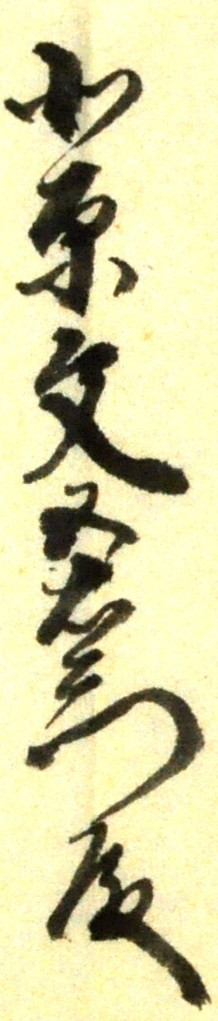北原文五右ヱ門殿
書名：孝女そよ御称美御書付・写
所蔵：伊那市立高遠町図書館・合同会社AMANE
